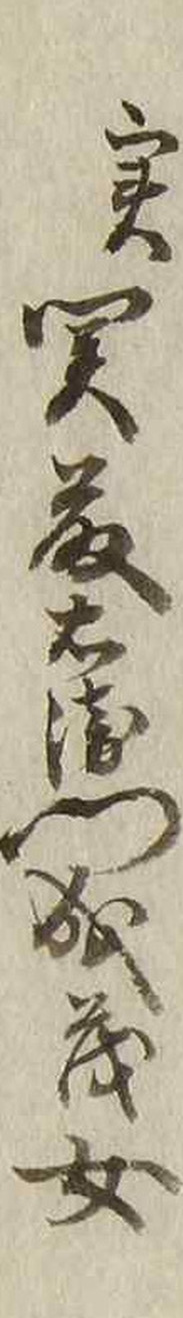関藤右衛門成茂女

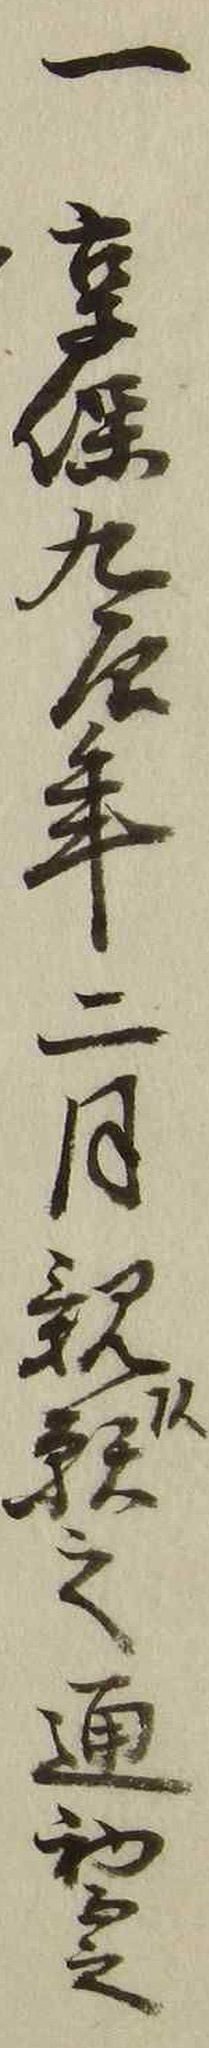一享保九辰年二月親頭願之通初而之
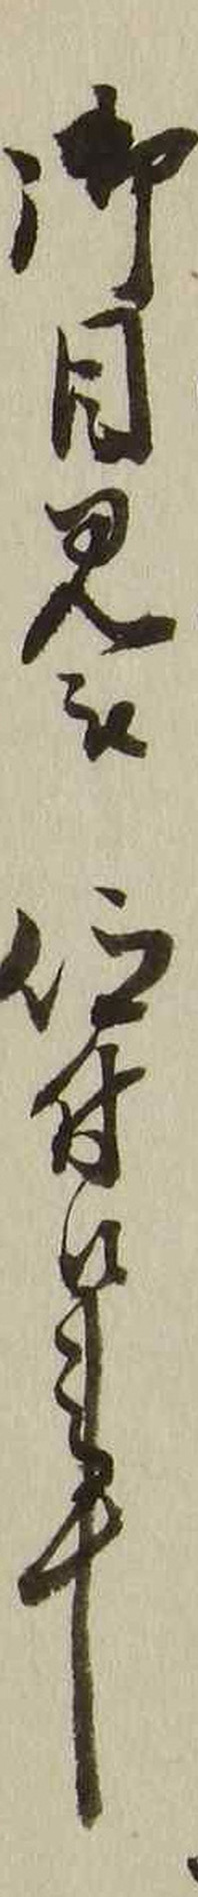御目見被仰付候事
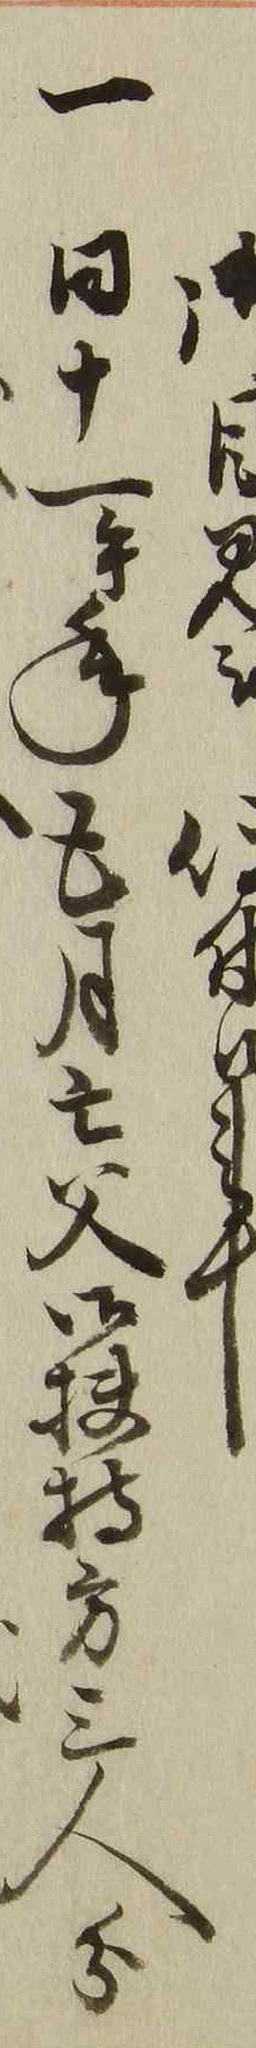一同十一午年五月亡父御扶持方三人分
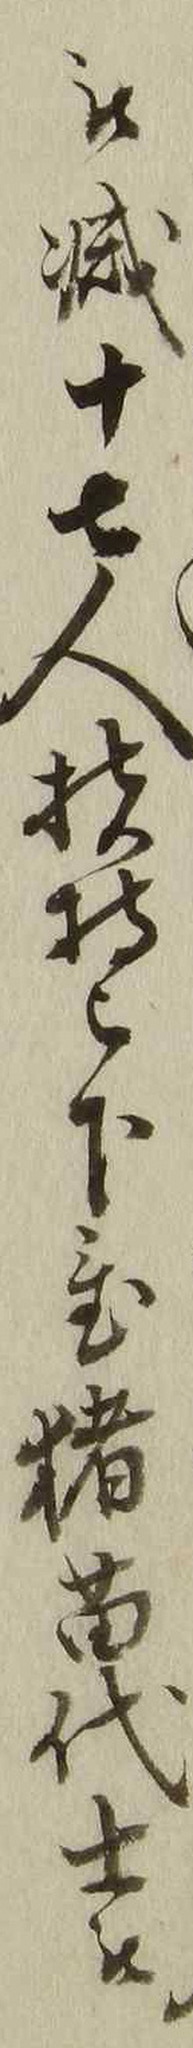被減十七扶持被下置猪苗代士被
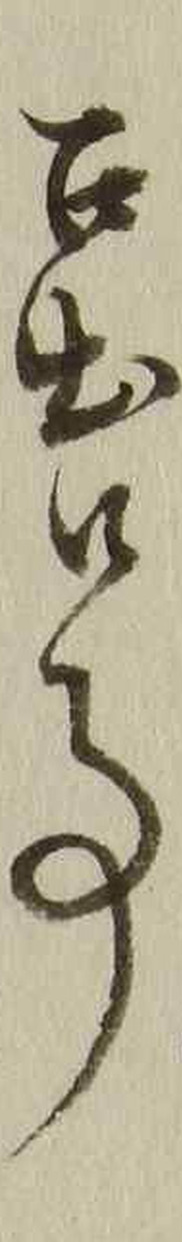召出候事
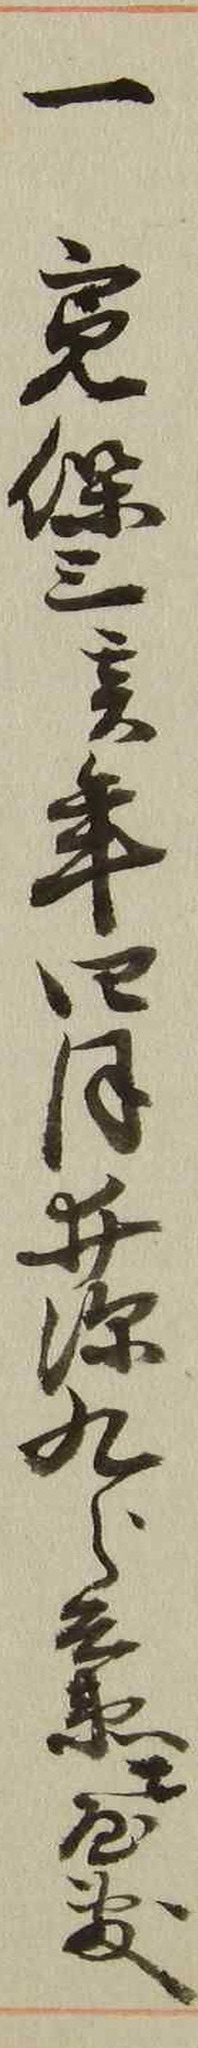一寛保三亥年四月井深九郎兵衛と屋敷
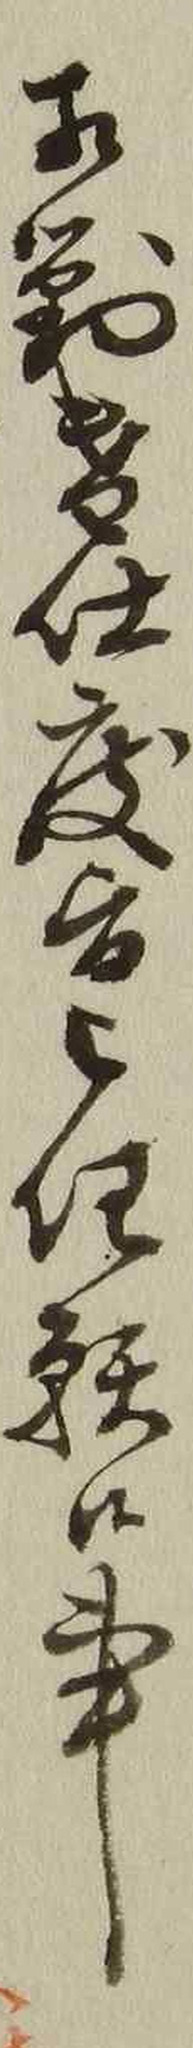相對替仕度旨被任願候事
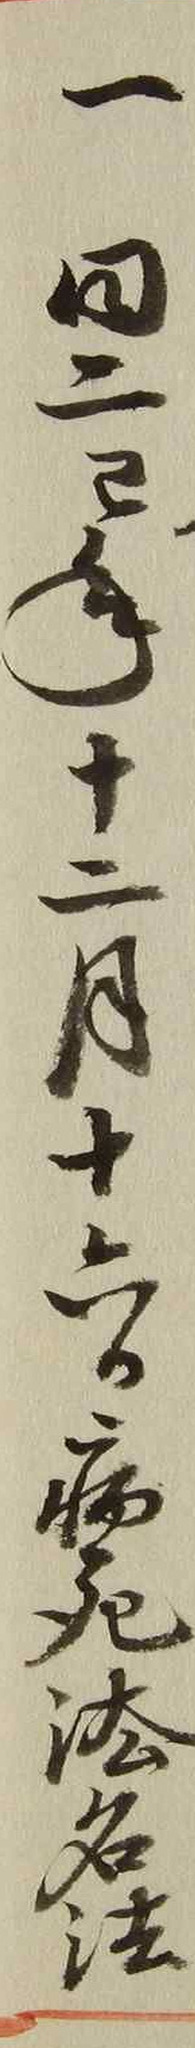同二巳年十二月十六日病死法名法
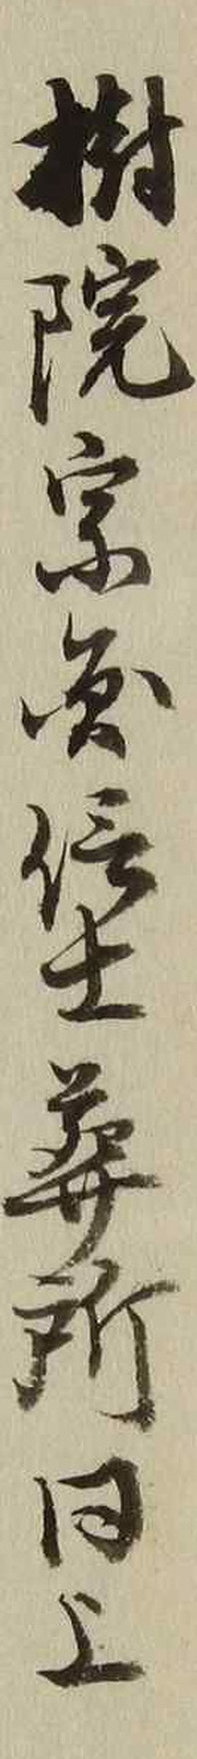樹院宗円信士葬所同上
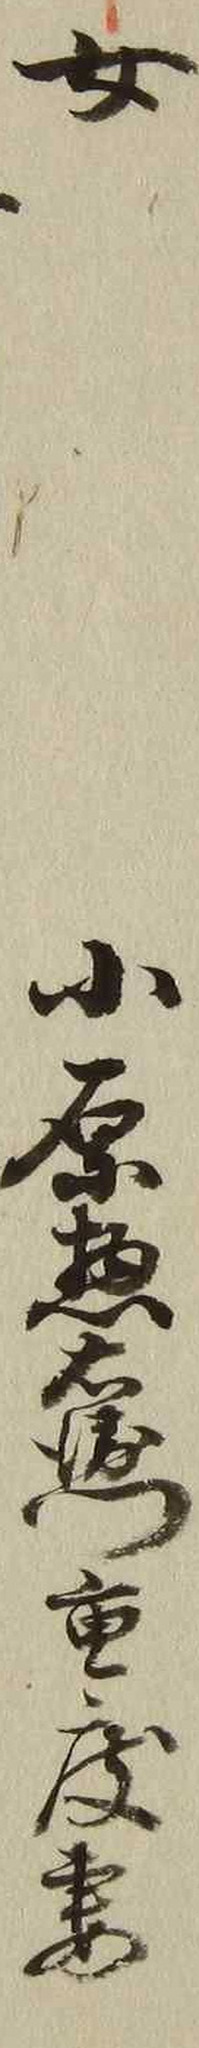女小原惣右衛門重慶妻
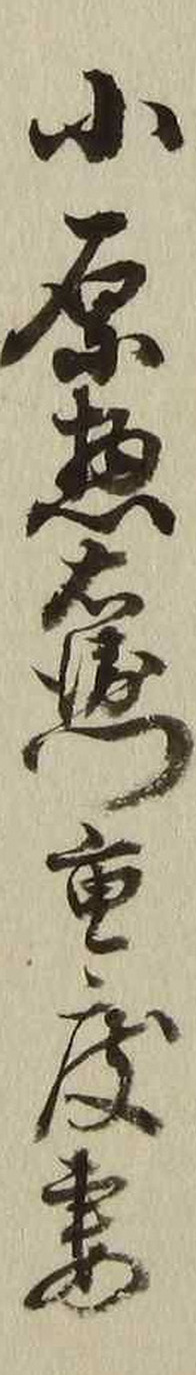女小原惣右衛門重慶妻
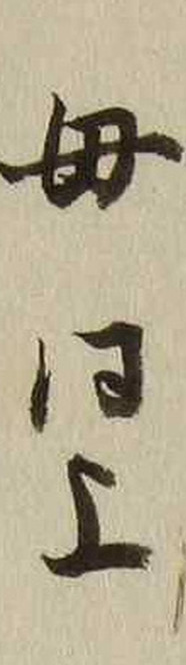母同上
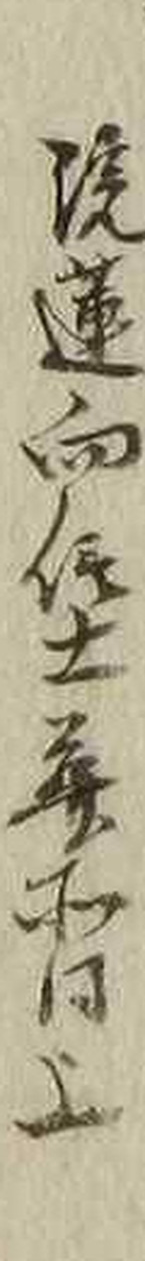樹院宗円信士葬所同上
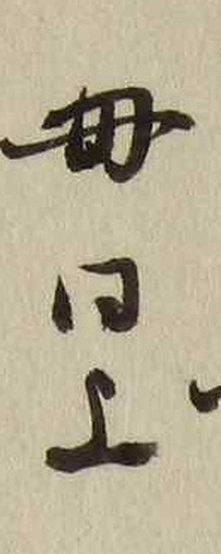母同上
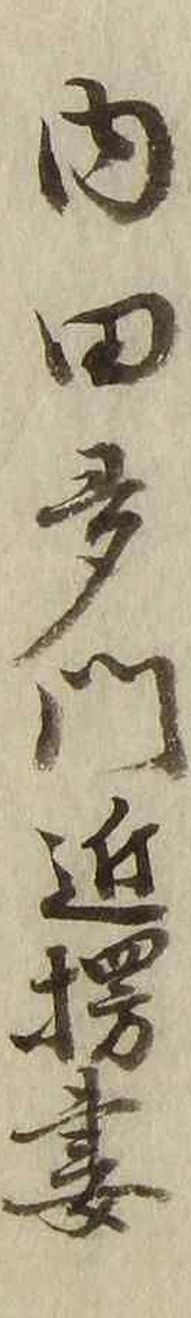女内田多門近楞妻
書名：諸士系譜　巻之31　い之部31
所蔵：会津若松市立会津図書館
